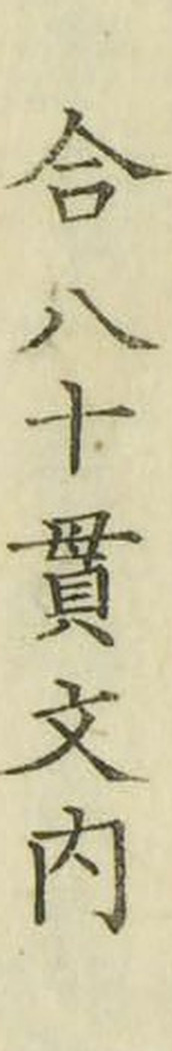合八十貫文内
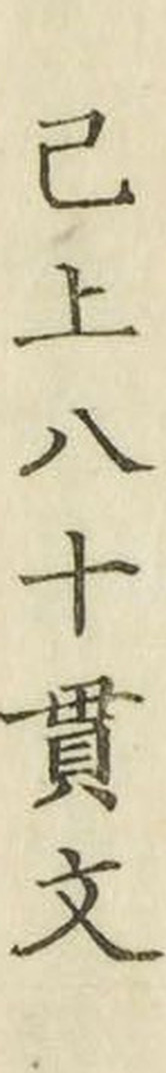已上八十貫文
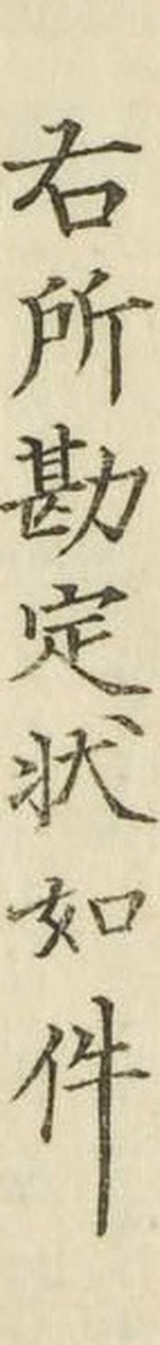右所勘定状如件
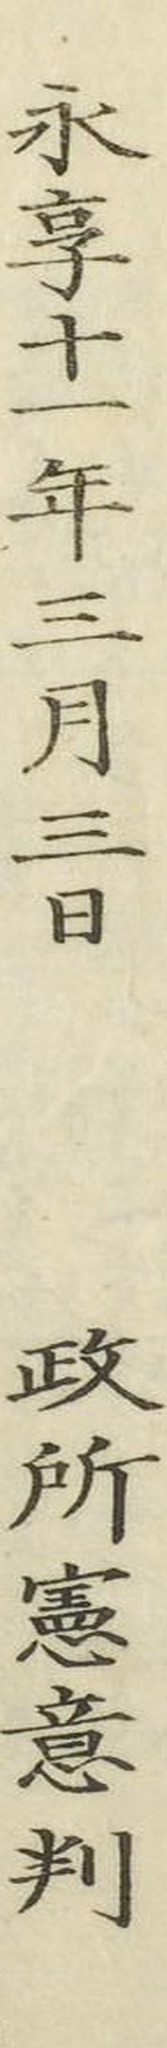永享十一年三月三日政所憲意判
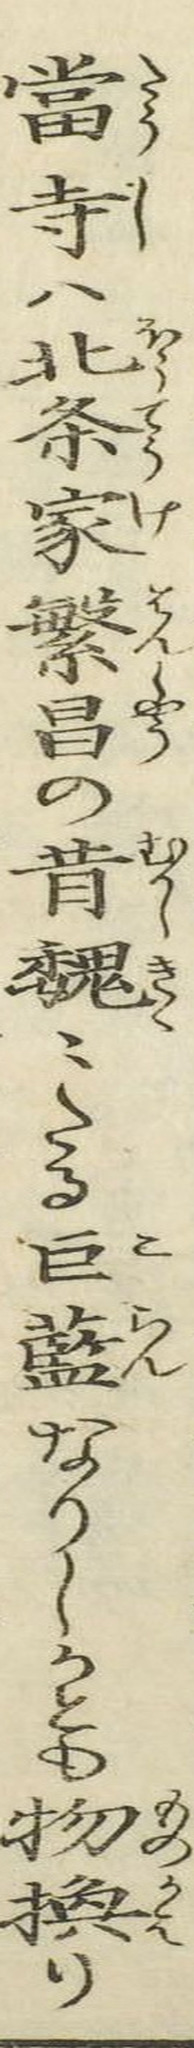當寺は北条家繁昌の昔魏々たる巨籃なりしかとも物換り
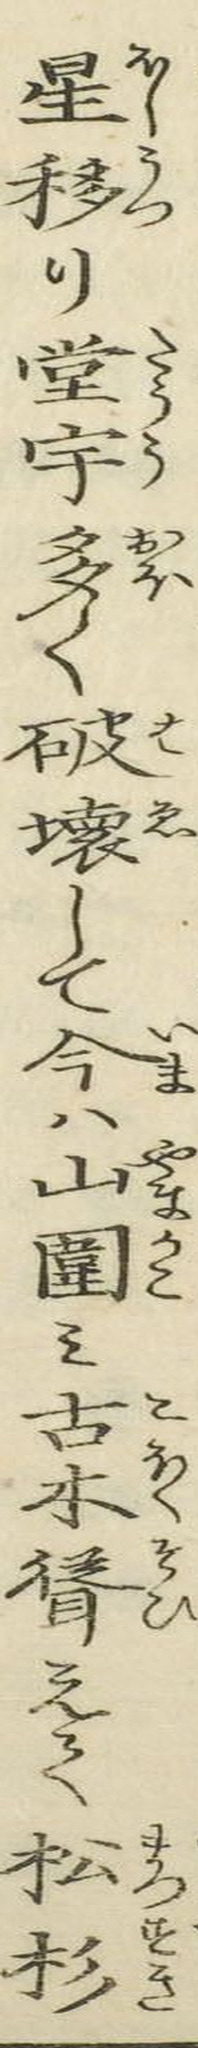星移り堂宇多く破壊して今は山圍み古木聳えて松杉
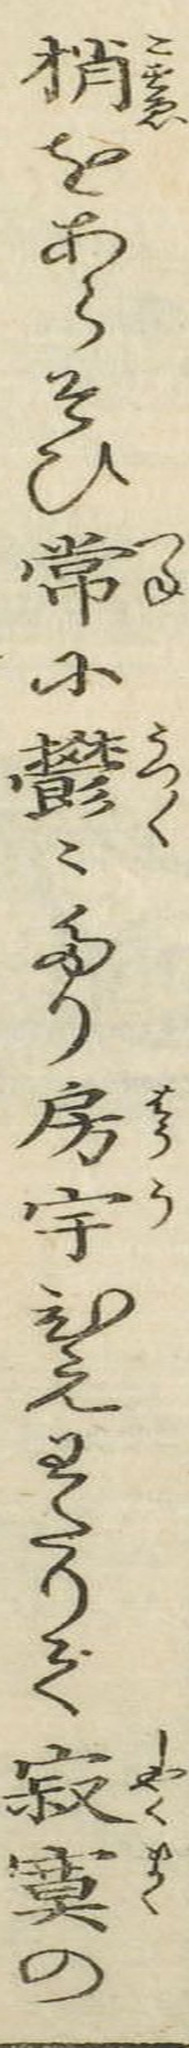梢をあらそひ常に鬱々たり房宇ひえわたりて寂寞の
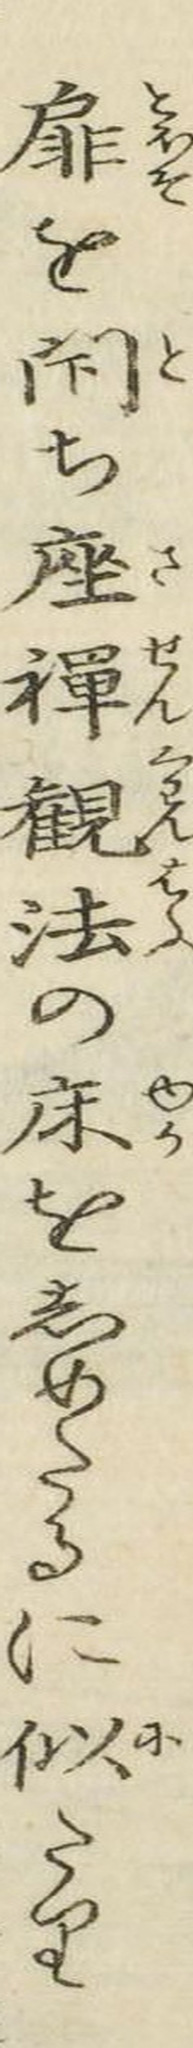扉を閇ち座禪観法の床をしめたるに似たり
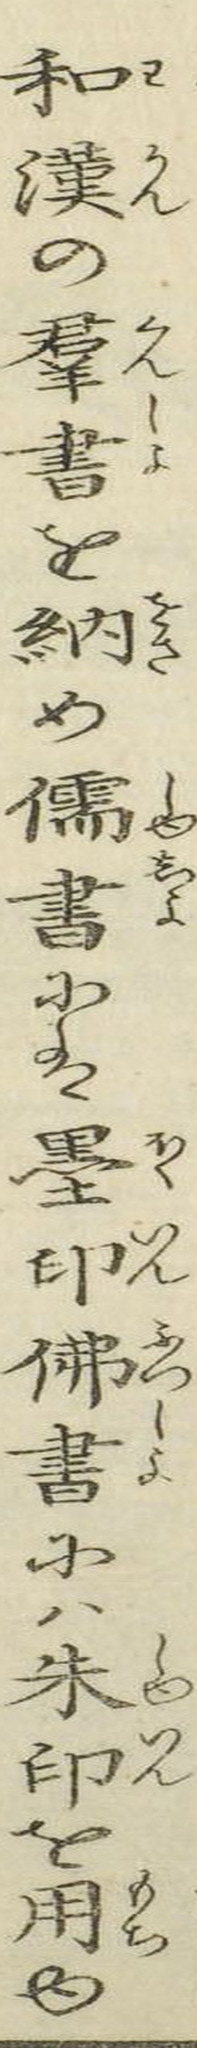和漢の羣書を納め儒書には墨印佛書には朱印を用ゆ
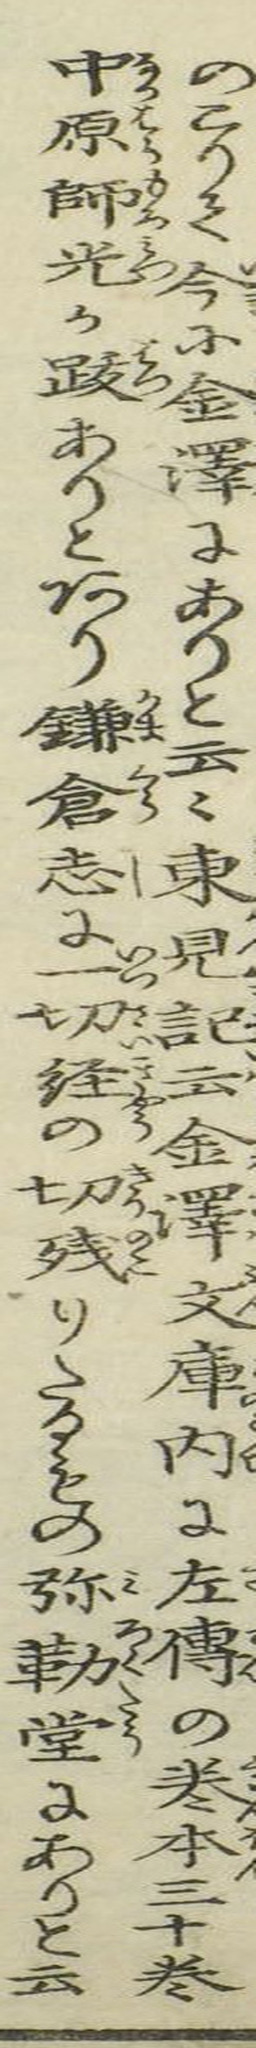中原師光か䟦ありとあり鎌倉志に一切経の切残りたるもの弥勒堂にありと云

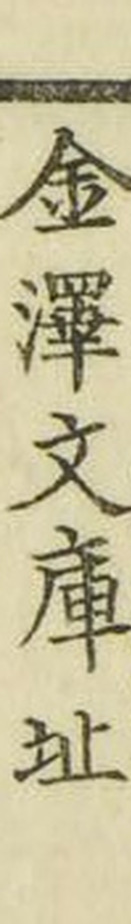金澤文庫址

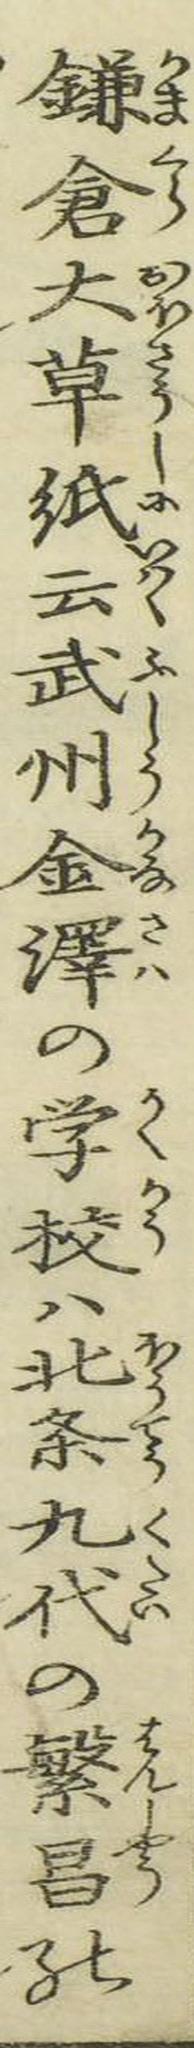鎌倉大草紙云武州金澤の学校は北条九代の繁昌の
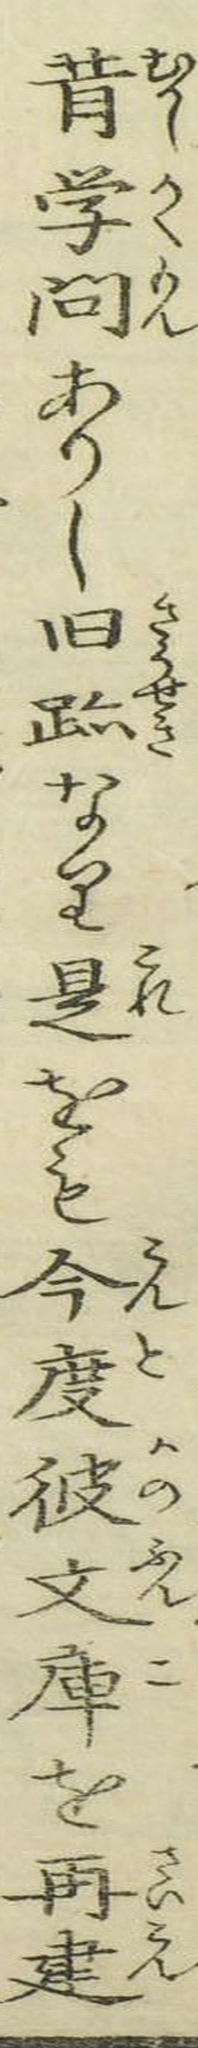昔学問ありし旧跡なり是をも今度彼文庫を再建
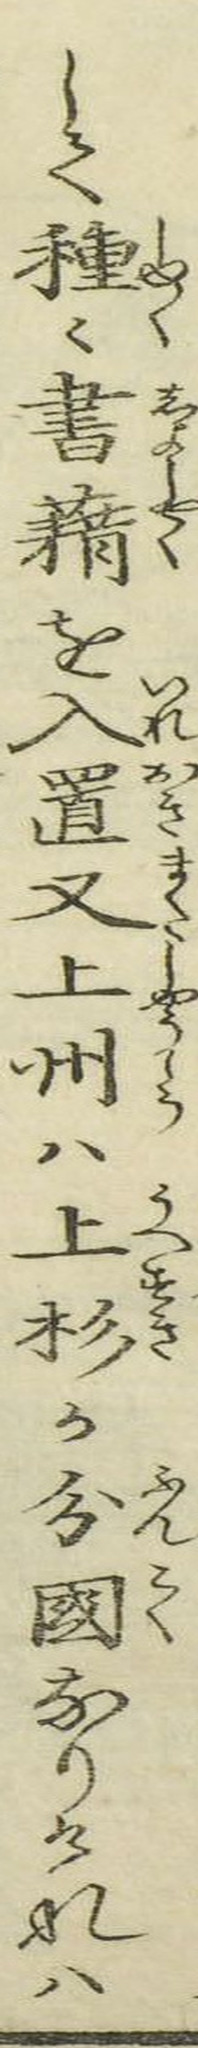して種々書藉を入置又上州は上杉か分國なりけれは
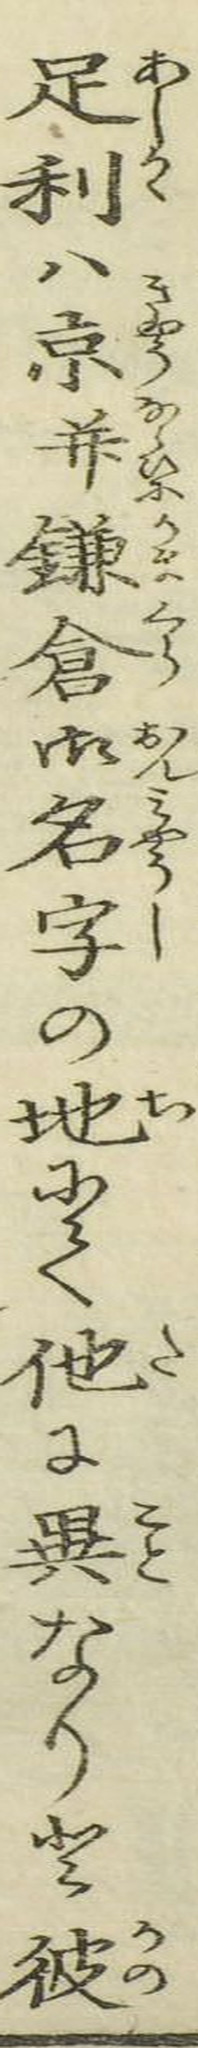足利は京幷鎌倉御名字の地にて他に異なりと彼
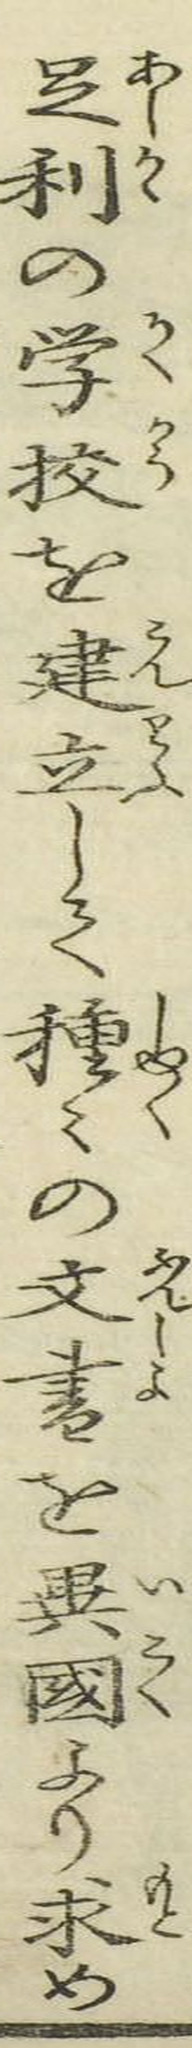足利の学校を建立して種々の文書を異國より求め
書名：江戸名所図会 20巻 巻之6
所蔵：東京学芸大学教育コンテンツアーカイブ
